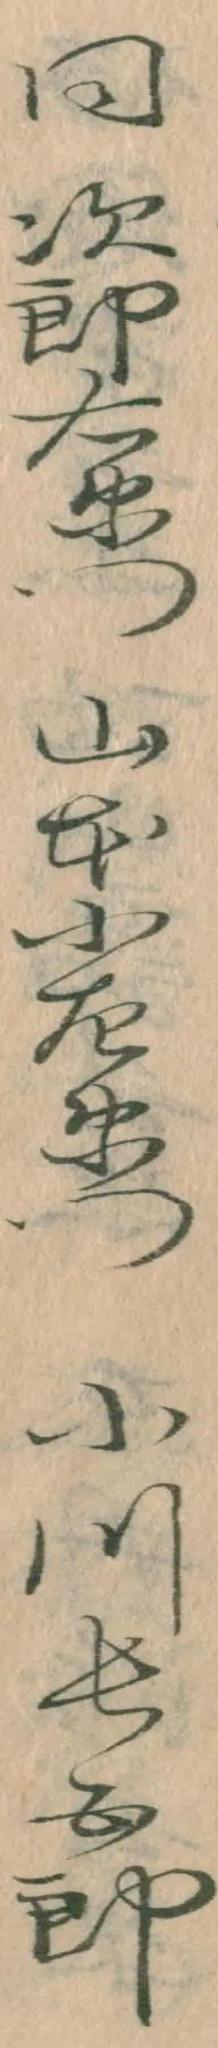同次郎右衛門山本小左衛門小川長五郎
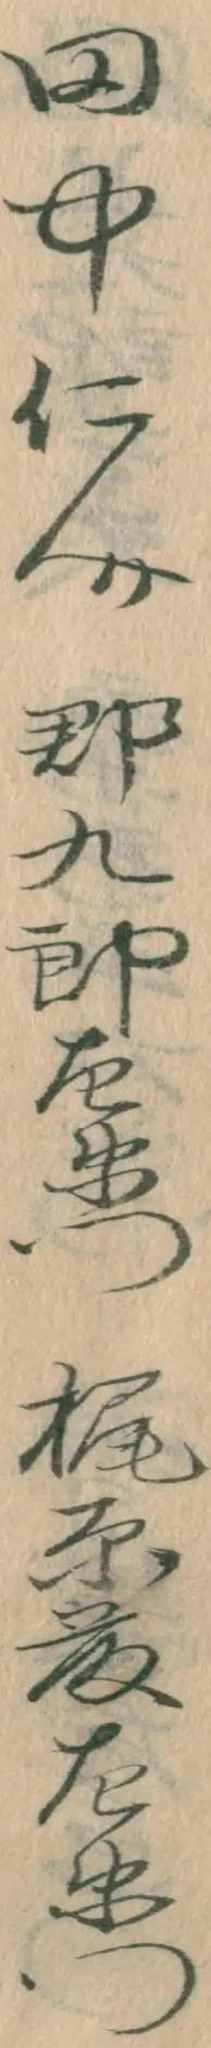田中仁介郡九郎左衛門梶原藤左衛門
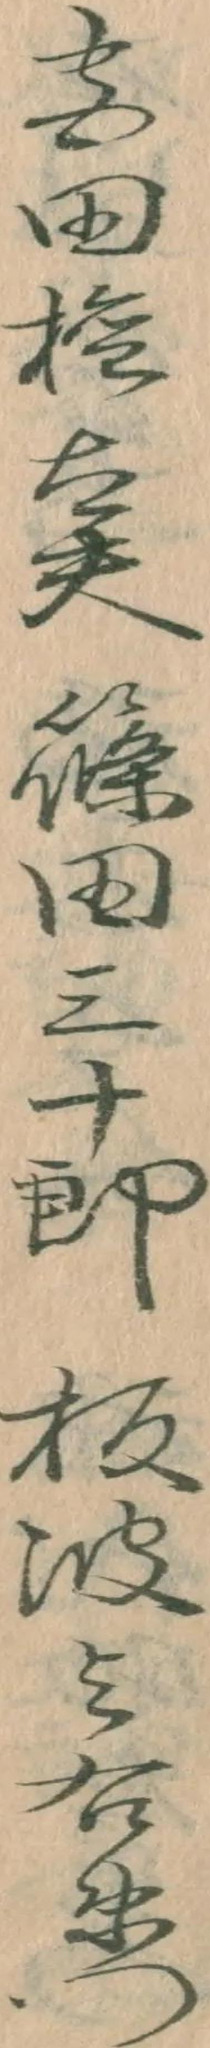宮田権太夫篠田三十郎板波与右衛門
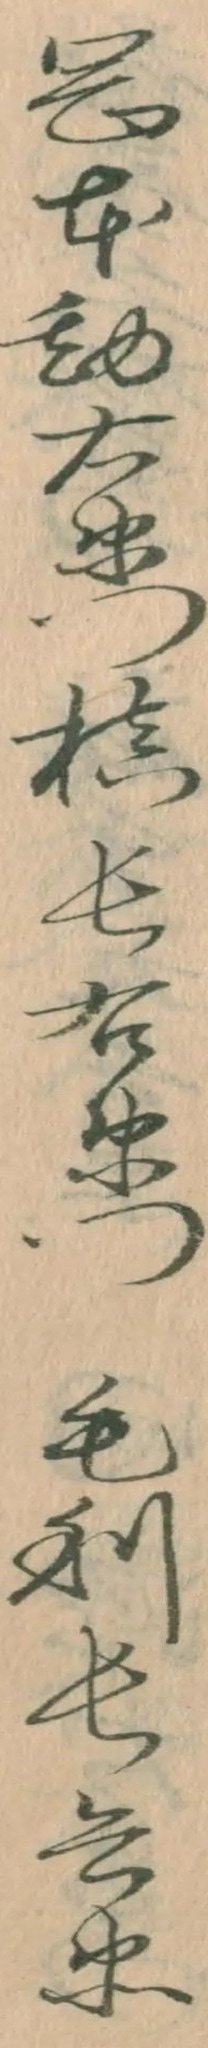岸本勘右衛門槙長右衛門毛利長兵衛

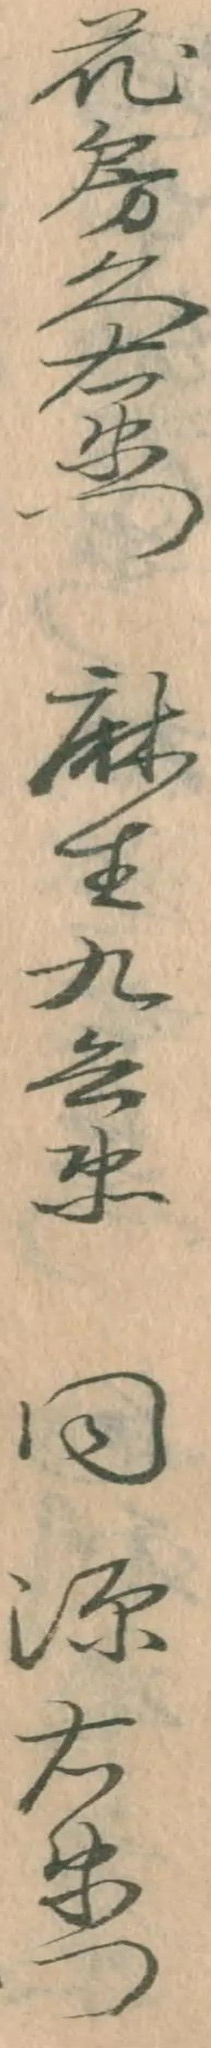花房久右衛門麻生九兵衛同源右衛門
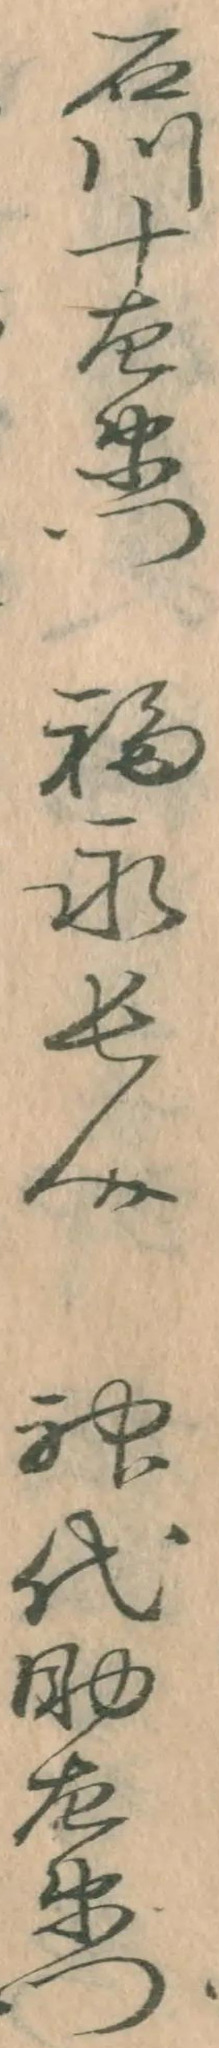石川十左衛門福永長助神代助左衛門
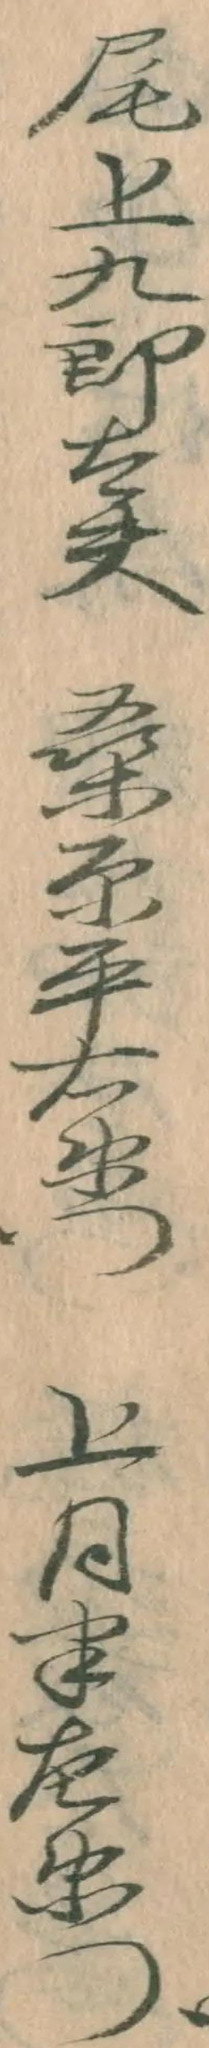尾上九郎太夫桑原平右衛門上月半左衛門
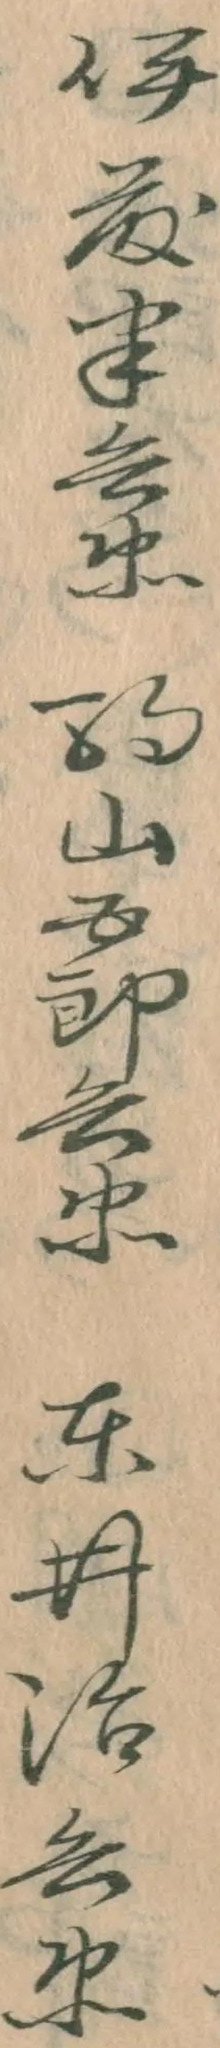伊藤半兵衛駒山五郎兵衛東井治兵衛
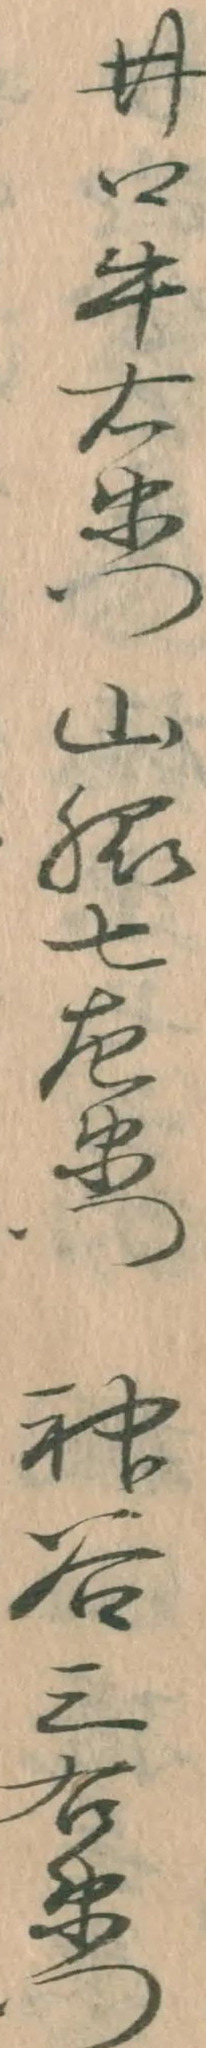井口牛右衛門山脇七左衛門神谷三右衛門
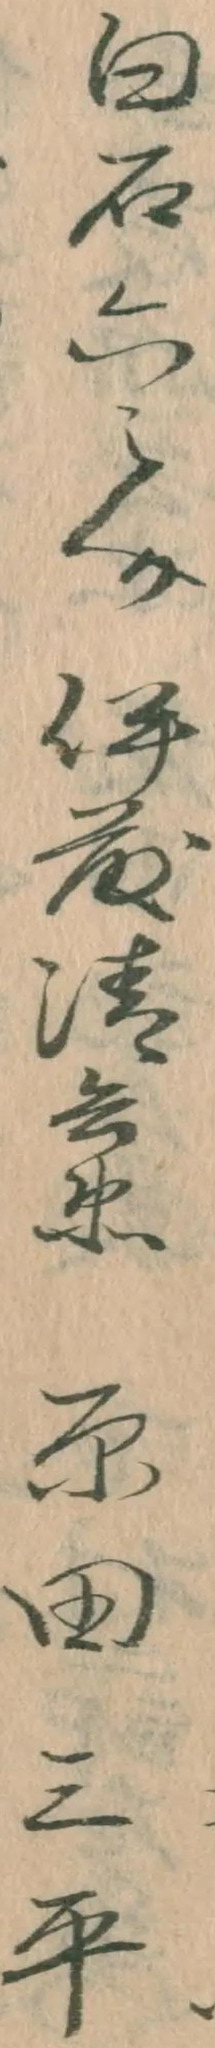白石六之丞伊藤清兵衛原田三平
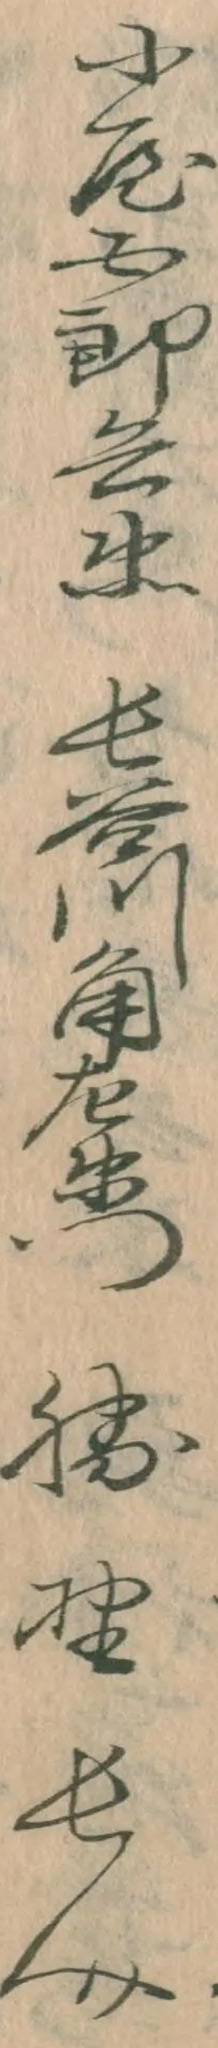小屋五郎兵衛長谷川各左衛門勝野長介
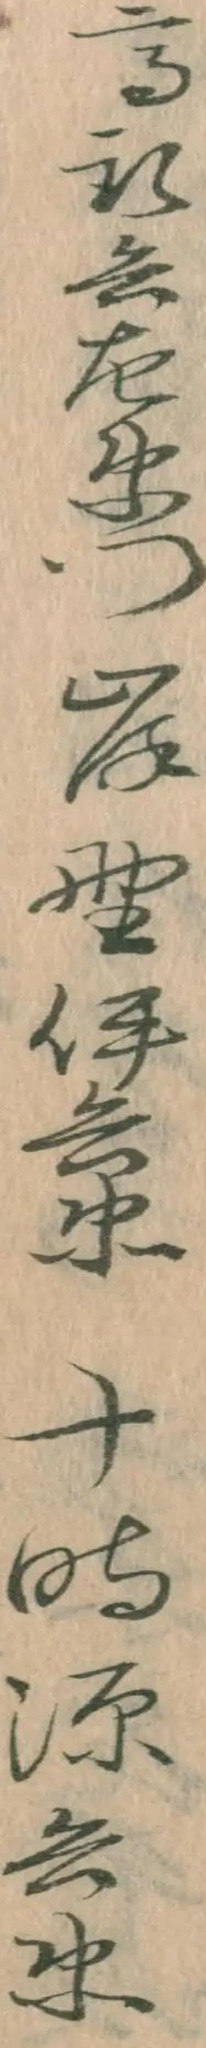高取兵左衛門岸野伊兵衛十時源兵衛
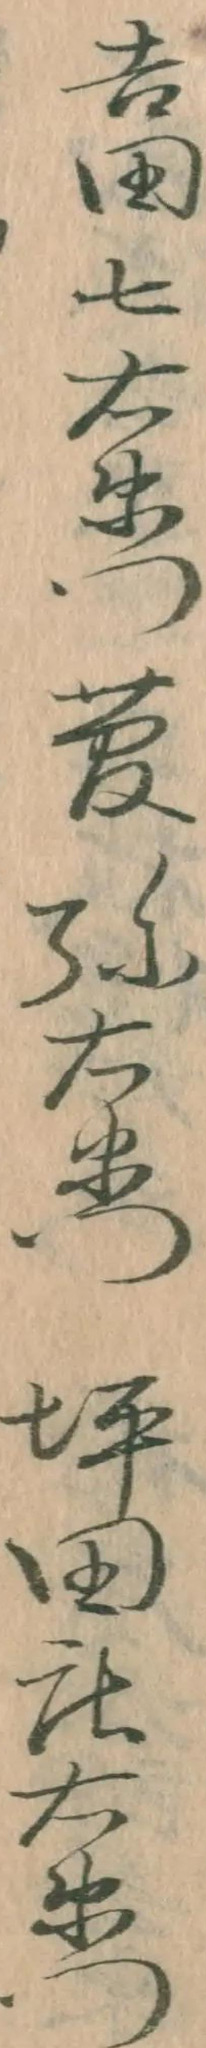吉田七右衛門菅弥右衛門坪田庄右衛門
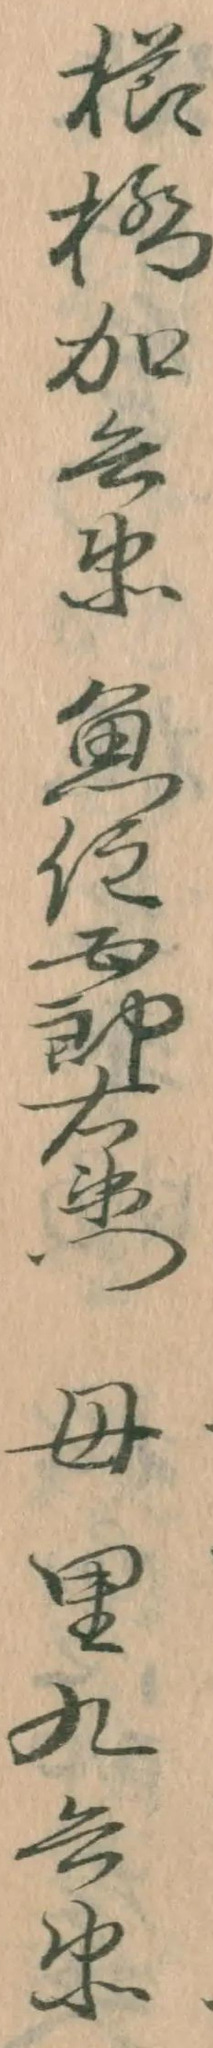櫛橋加兵衛魚住五郎右衛門母里九兵衛
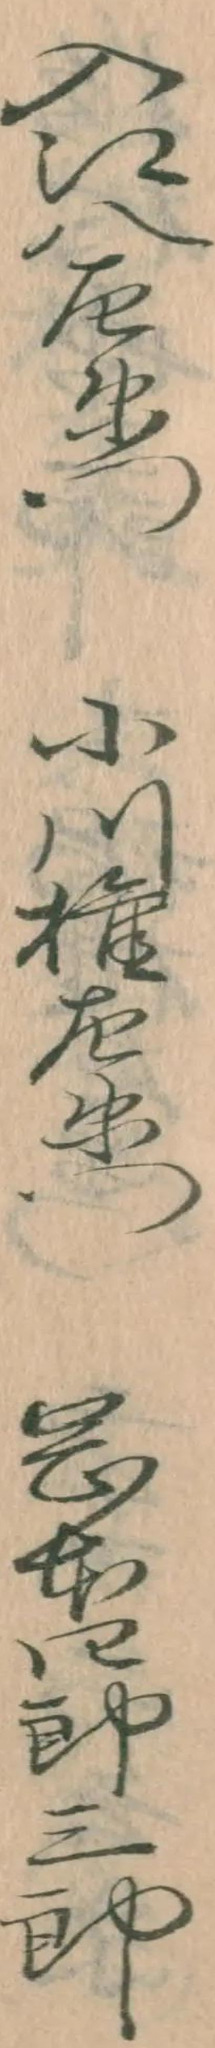入江左衛門小川権左衛門岡本四郎三郎
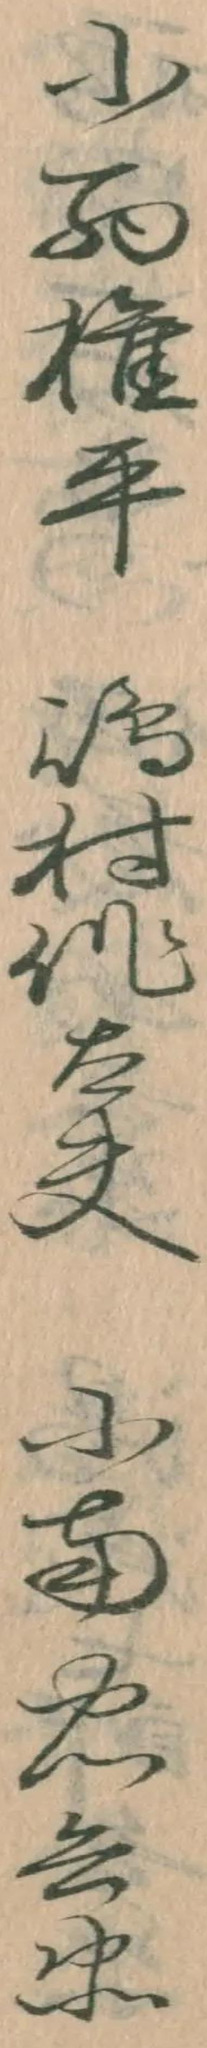小西権平島村作太夫小南忠兵衛
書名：切支丹御退治記 49巻. [9]
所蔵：国立国会図書館 National Diet Library, JAPAN
